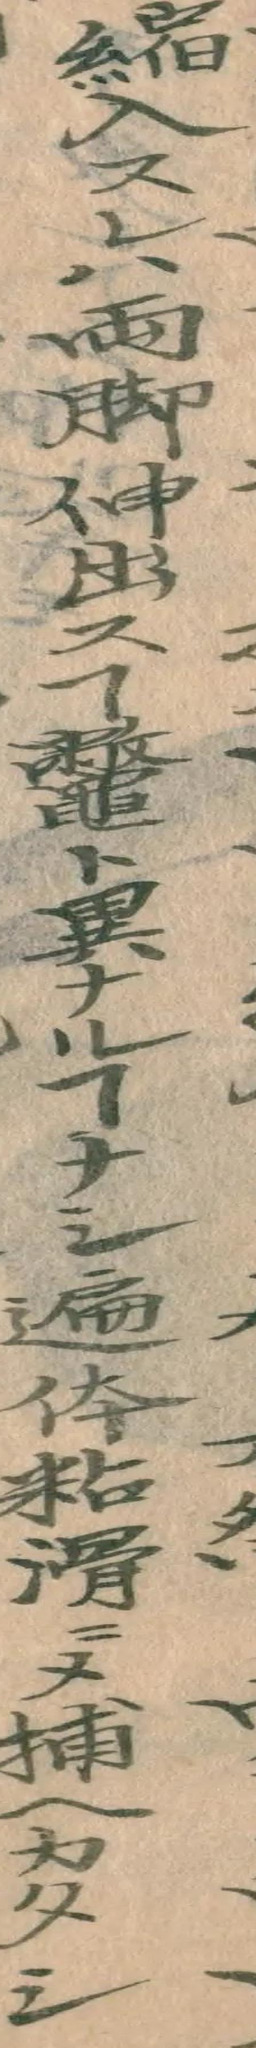縮入スレハ両脚伸出スコト鼈ト異ナルコトナシ遍体粘滑ニシテ捕ヘカタシ
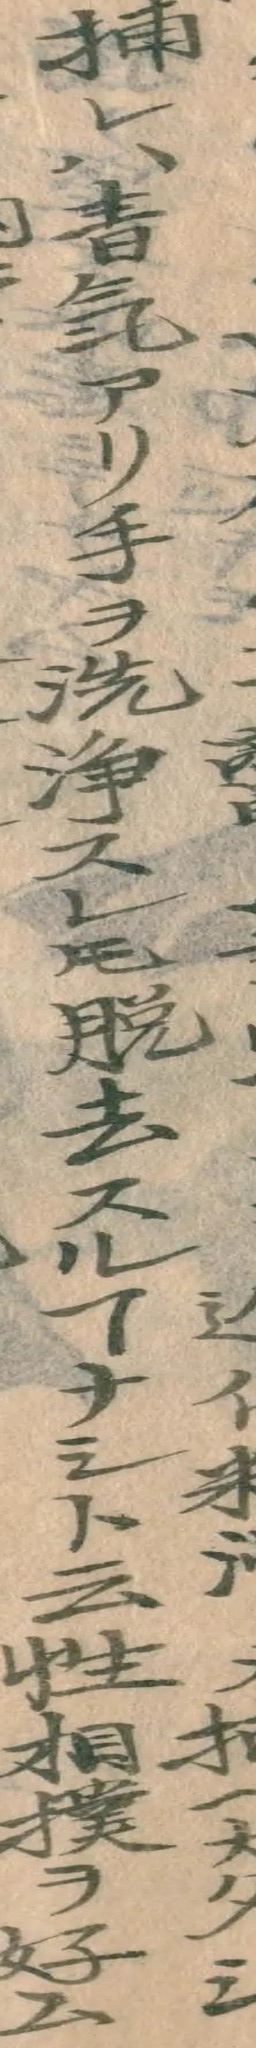捕レハ青気アリ手ヲ洗浄スレトモ脱去スルコトナシト云性相撲ヲ好ム
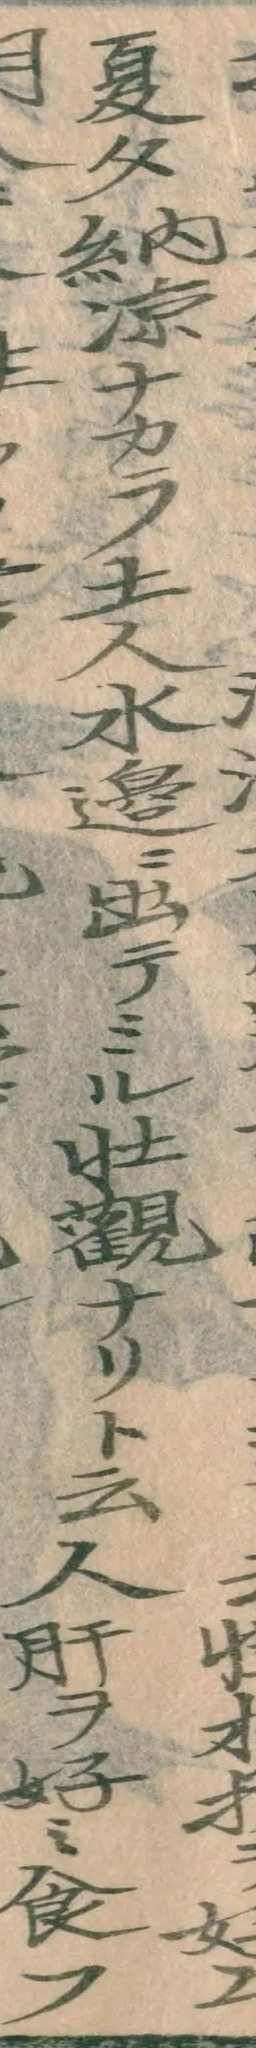夏夕納涼ナカラ土人水辺ニ出テミル壮観ナリト云人肝ヲ好ミ食フ
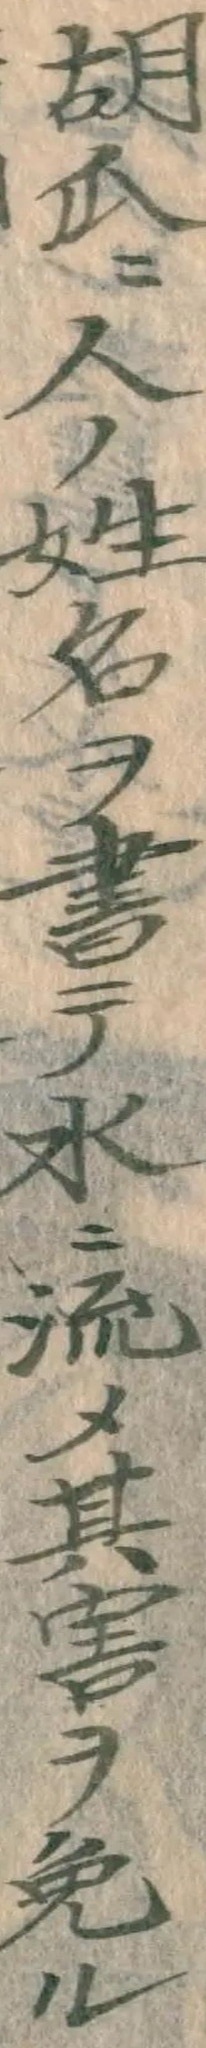胡瓜ニ人ノ姓名ヲ書テ水ニ流シテ其害ヲ免ル
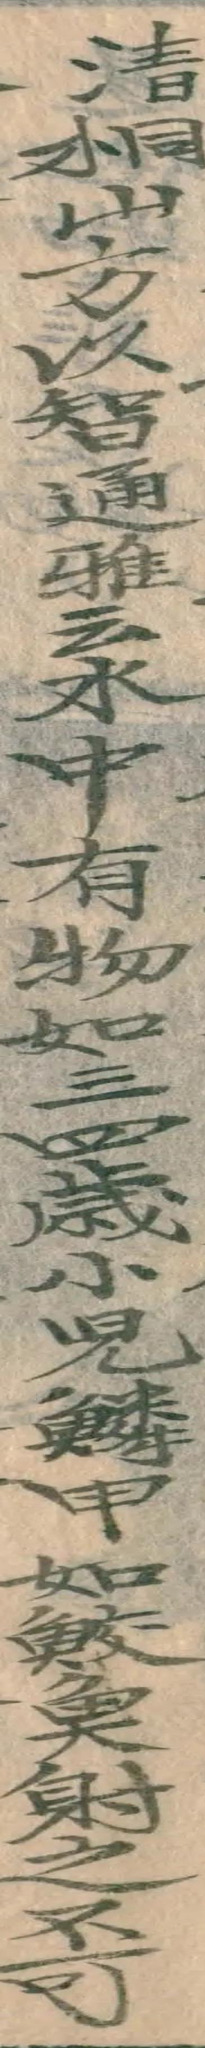清桐山方以智通雅云水中有物如三四歳小児鱗甲如鮫魚射之不可
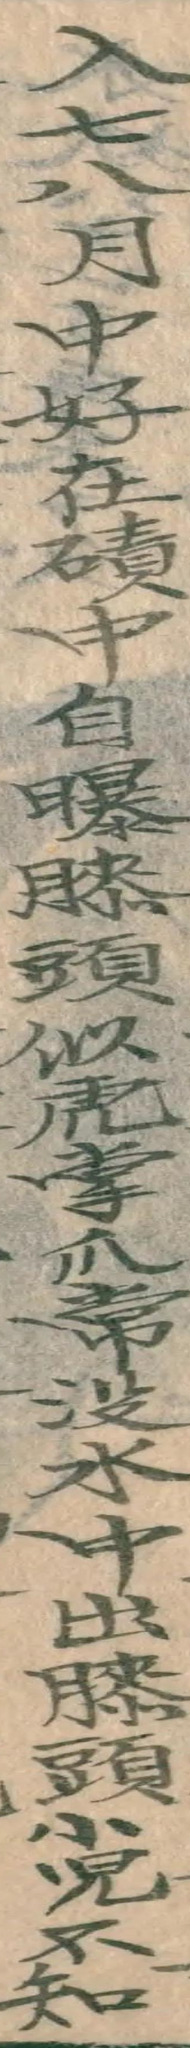入七八月中好在磧中自曝膝頭似虎掌爪常没水中出膝頭小児不知
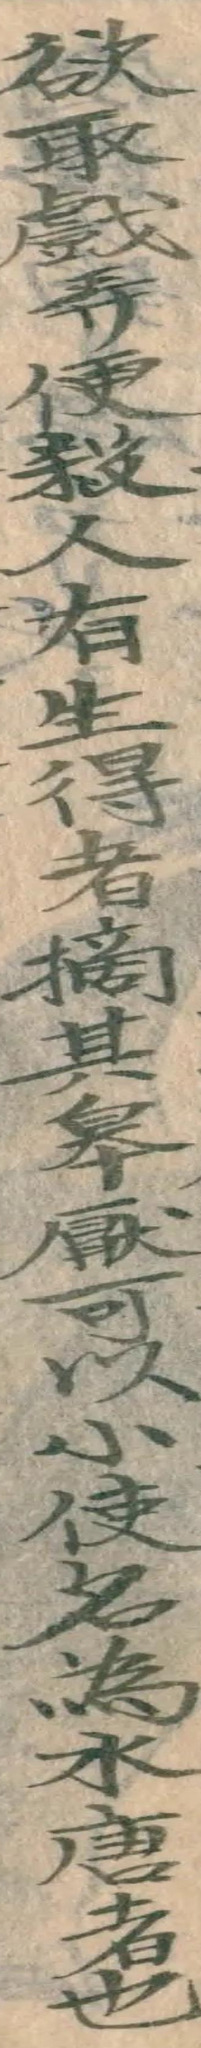欲取戯弄便殺人有生得者摘其皋厭可以小使名為水唐者也
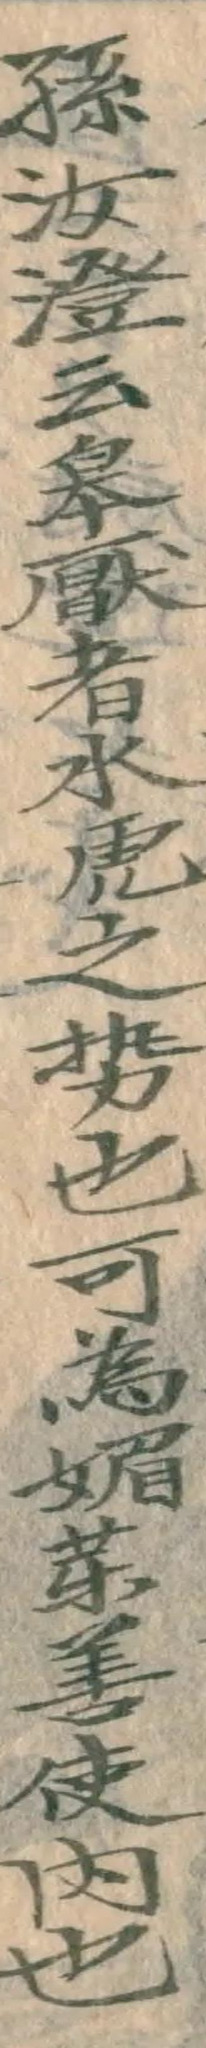孫汝澄云皋厭者水虎之势也可為媚薬善使内也
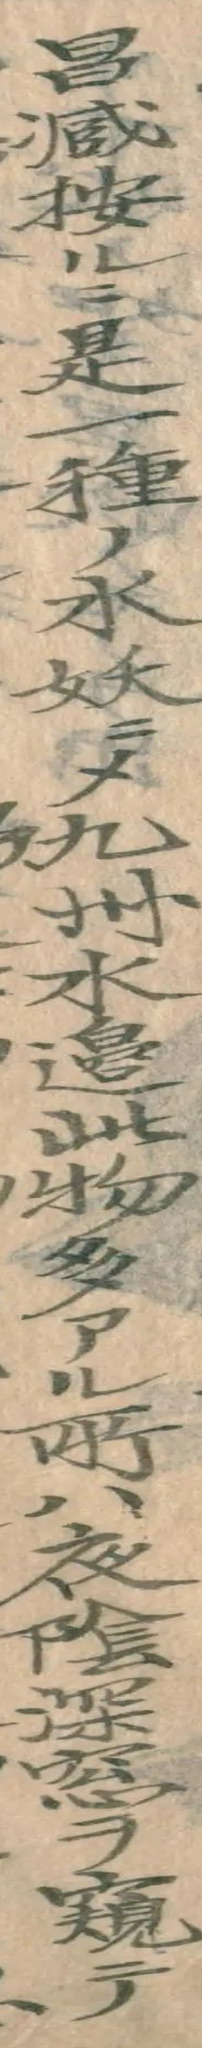昌按ルニ是一種ノ水妖ニシテ九州水邊此物多アル所ハ夜陰深窓ヲ窺テ
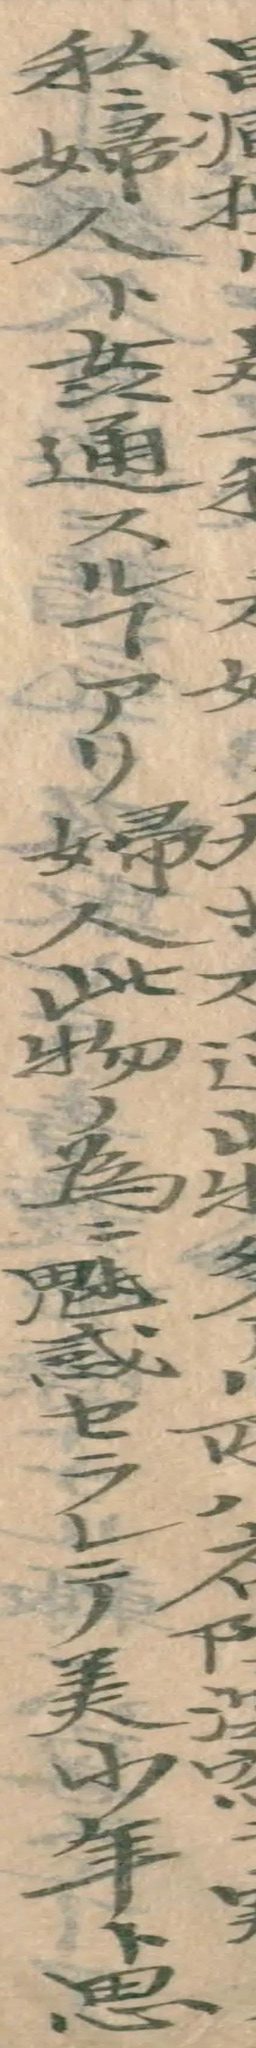私ニ婦人ト姦通スルコトアリ婦人此物ノ為ニ魅惑セラレテ美少年ト思

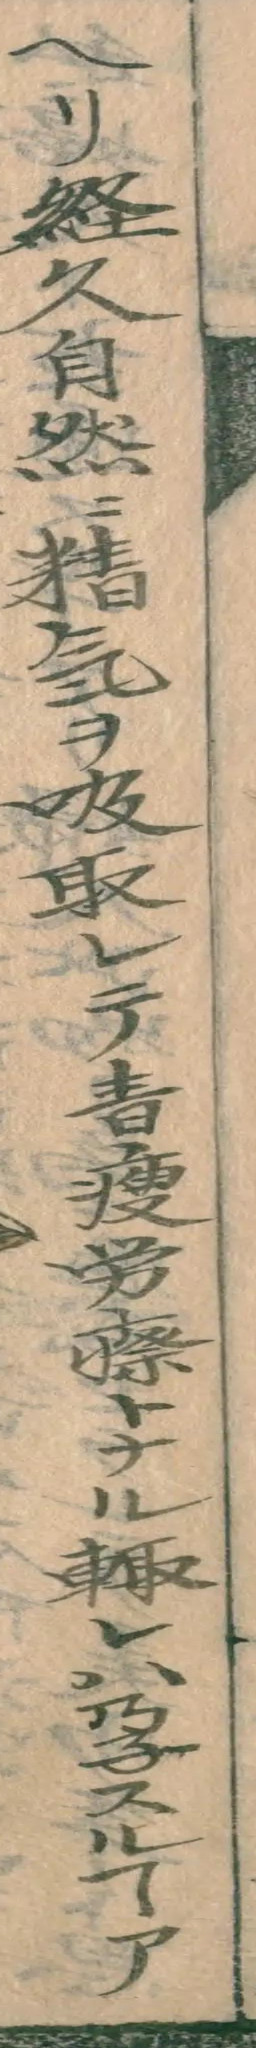ヘリ経久自然ニ精気ヲ吸取レテ青痩労瘵トナル輙レハ孕スルコトア
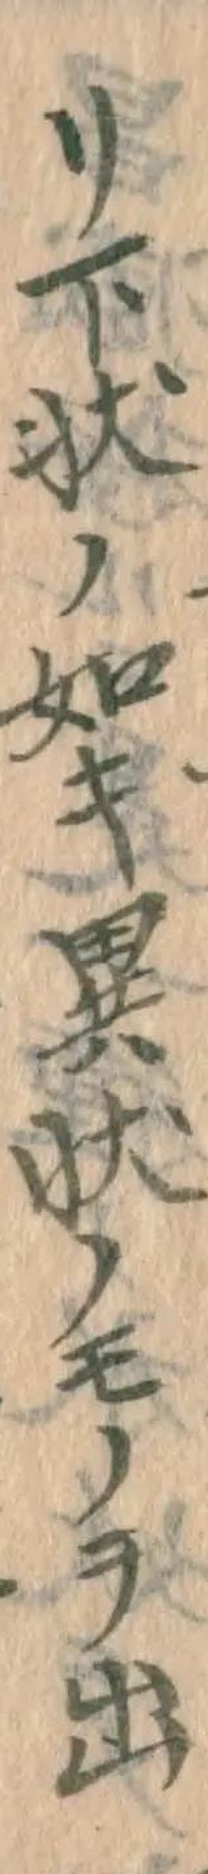リ下状ノ如キ異状ノモノヲ出
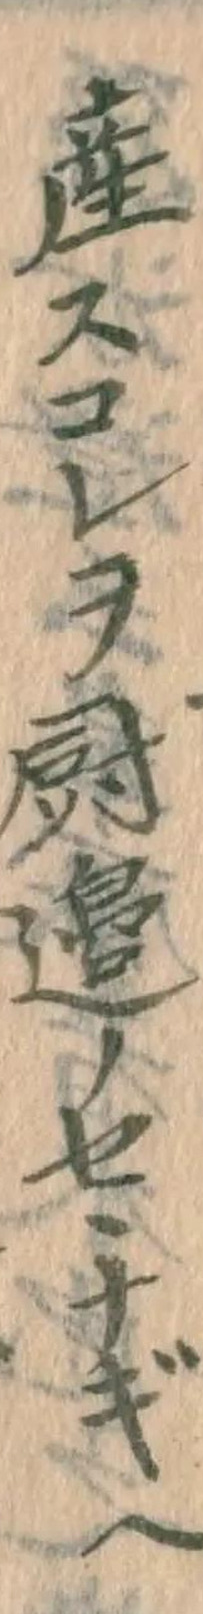産スコレヲ厨辺ノセヽナギヘ
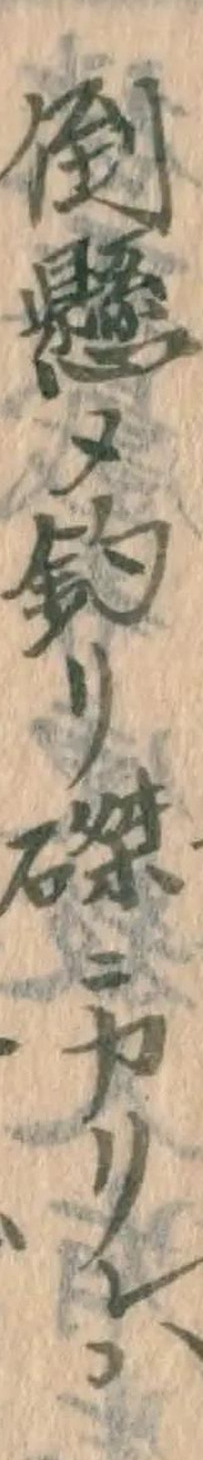倒懸シテ釣リ磔ニカクレハ
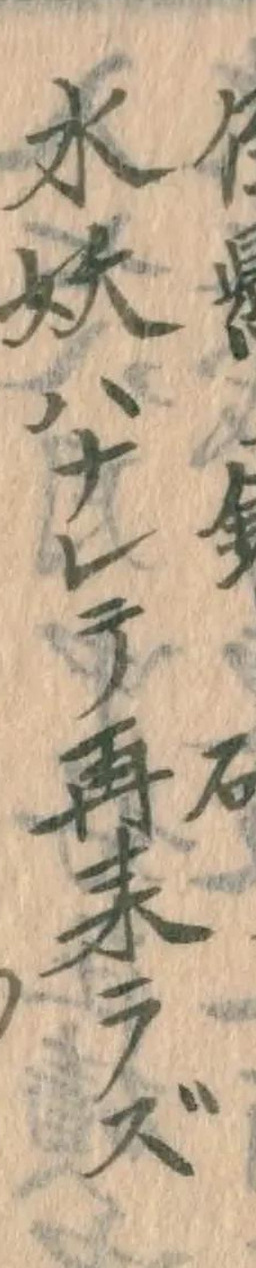水妖ハナレテ再来ラズ
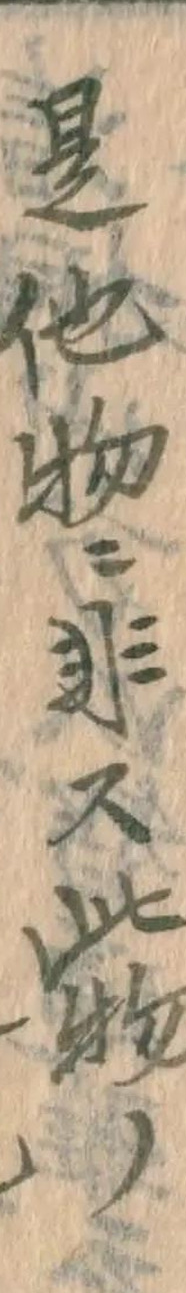是他物ニ非ス此物ノ
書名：千蟲譜 3巻. [3]
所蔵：国立国会図書館 National Diet Library, JAPAN
